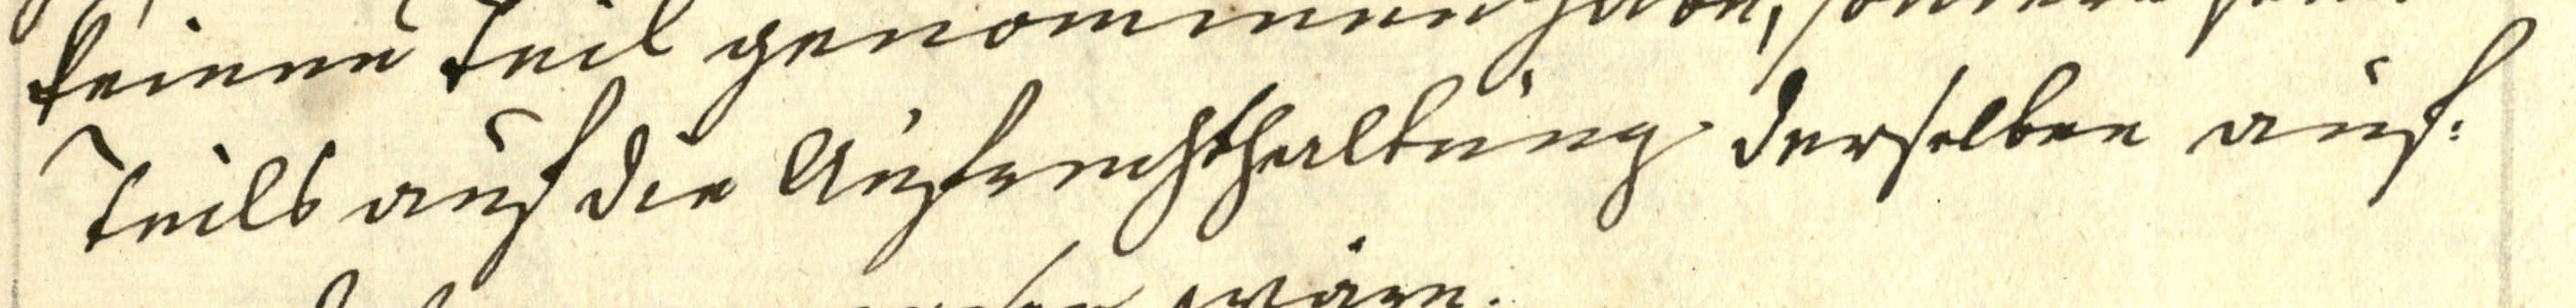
Teils auf die Aufrechthaltung derselben auf¬
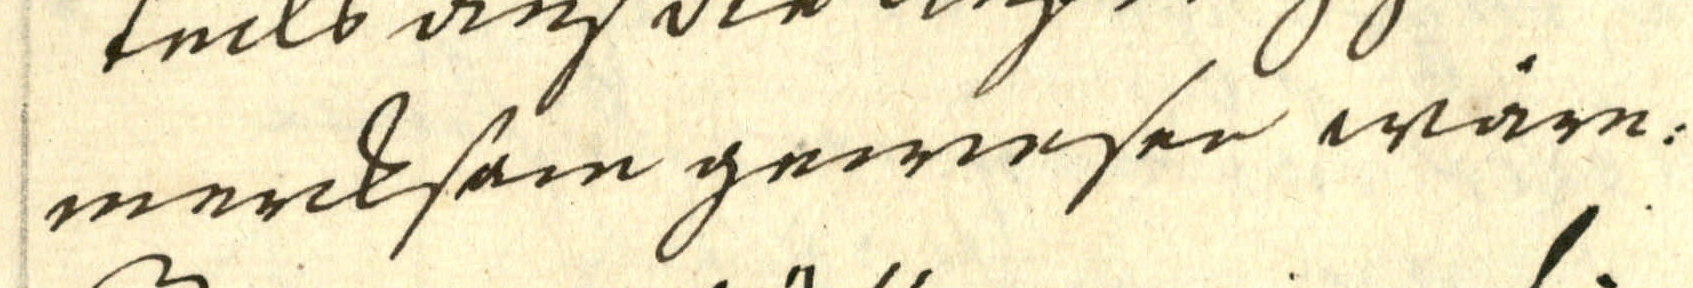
merksam gewesen wäre.
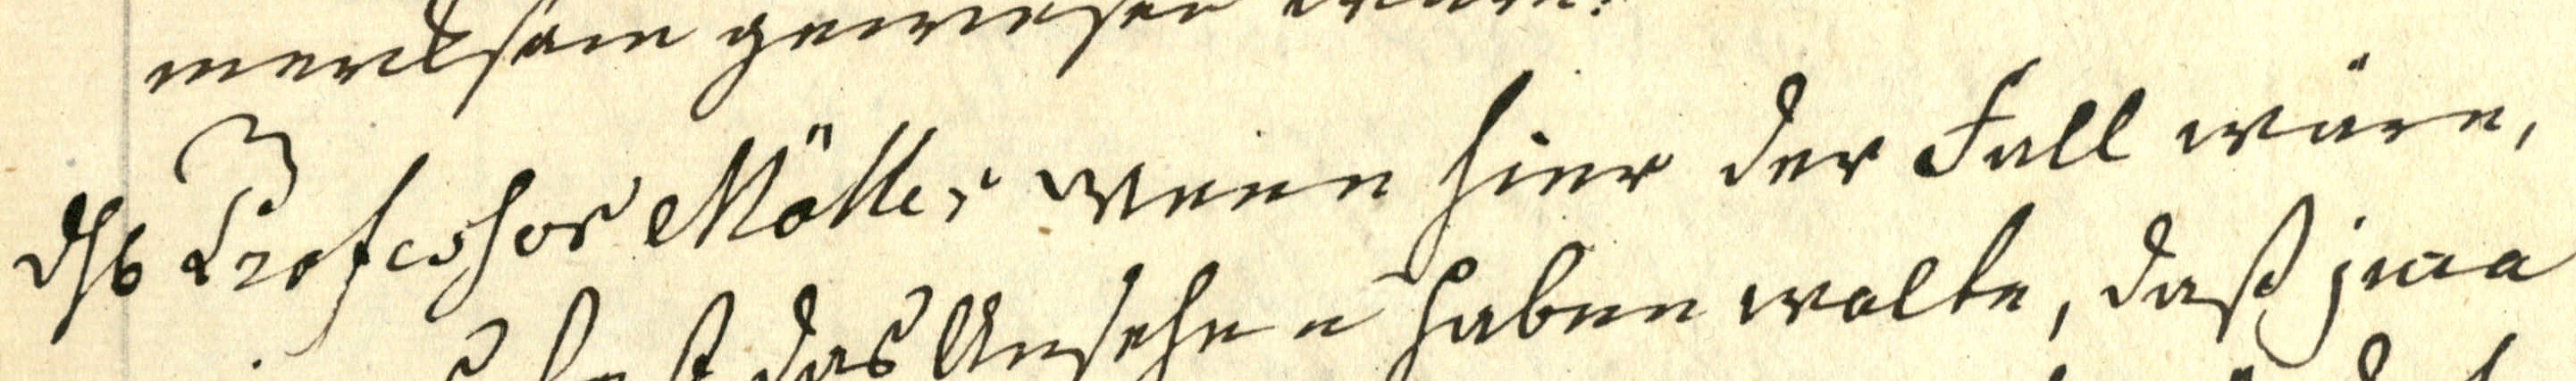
dh Professor Möller wenn hier der Fall wäre,
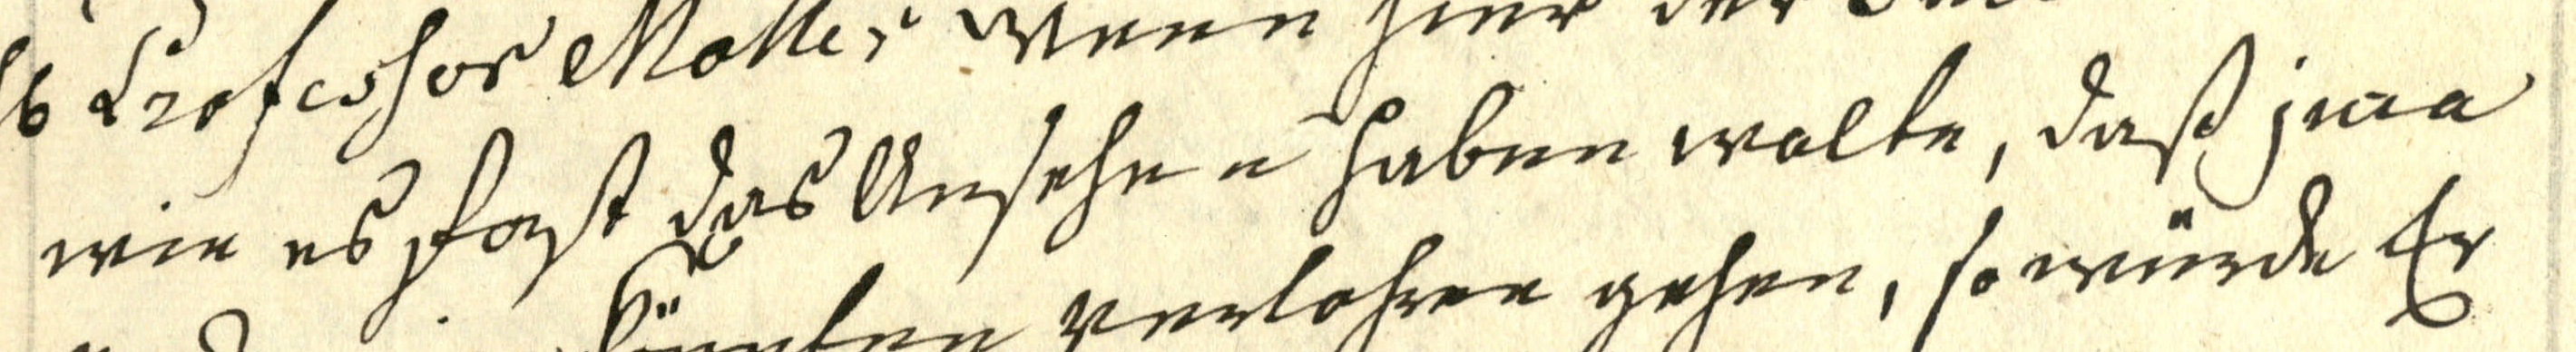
wie es fast das Ansehen haben wolte, daß jura
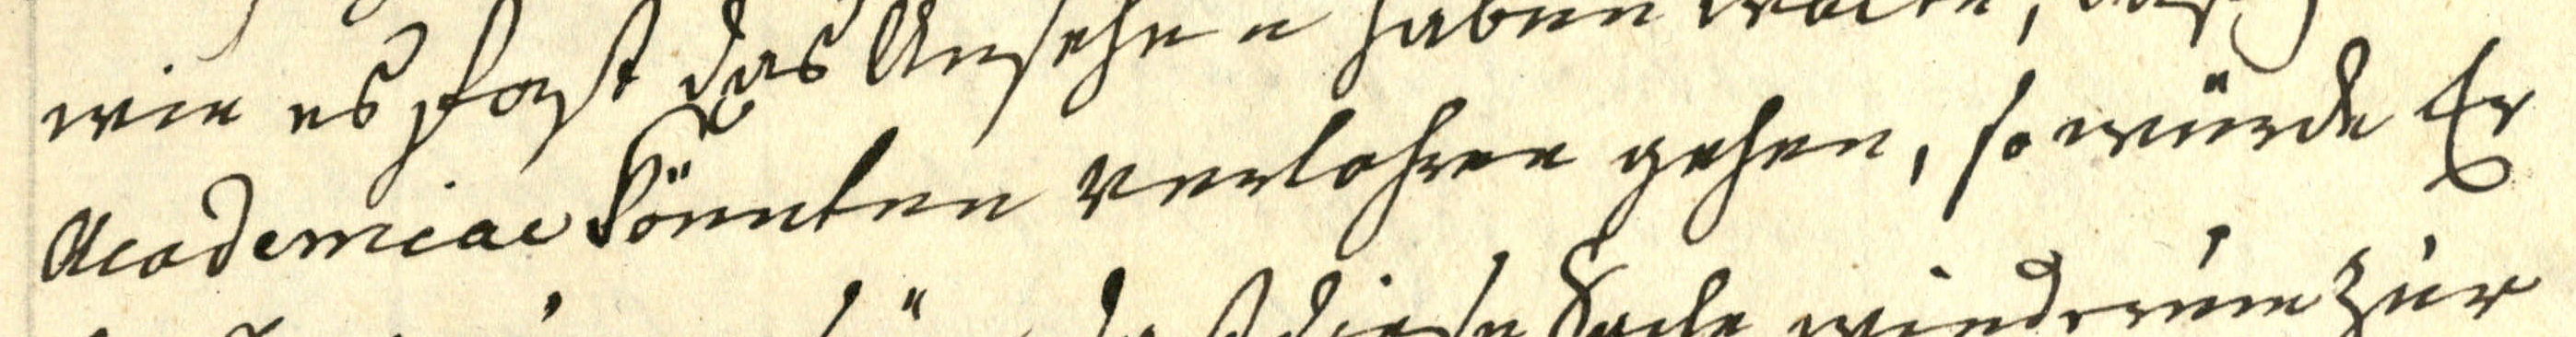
Academiae könnten verlohren gehen, so würde Er
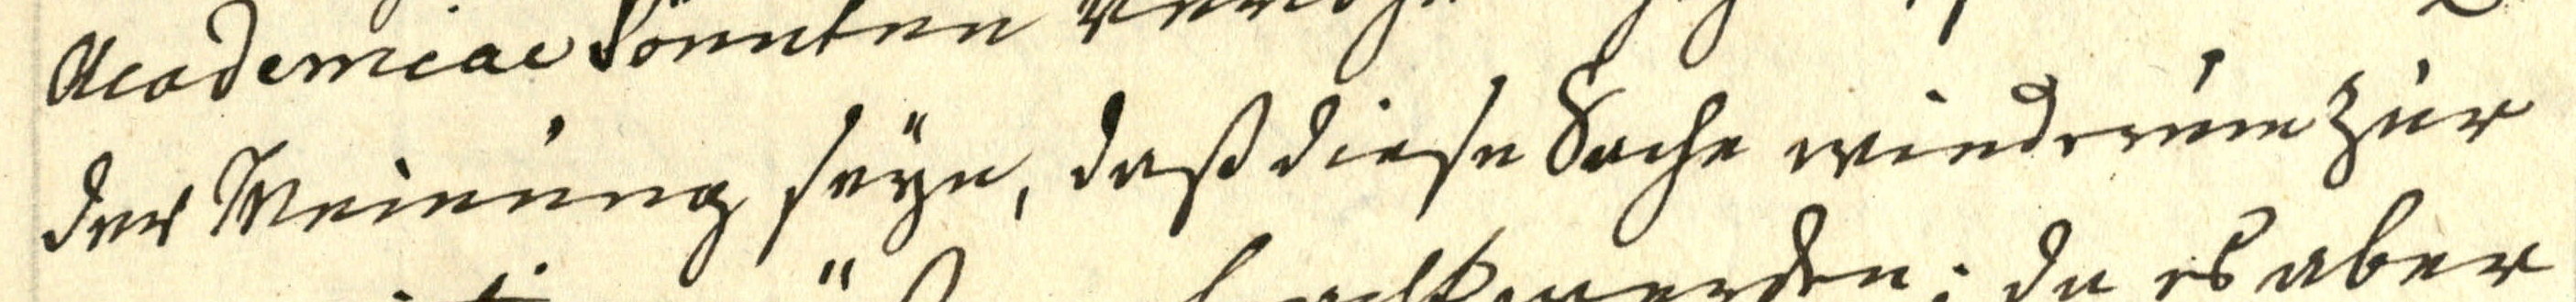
der Meinung seÿn, daß diese Sache wiederum zur
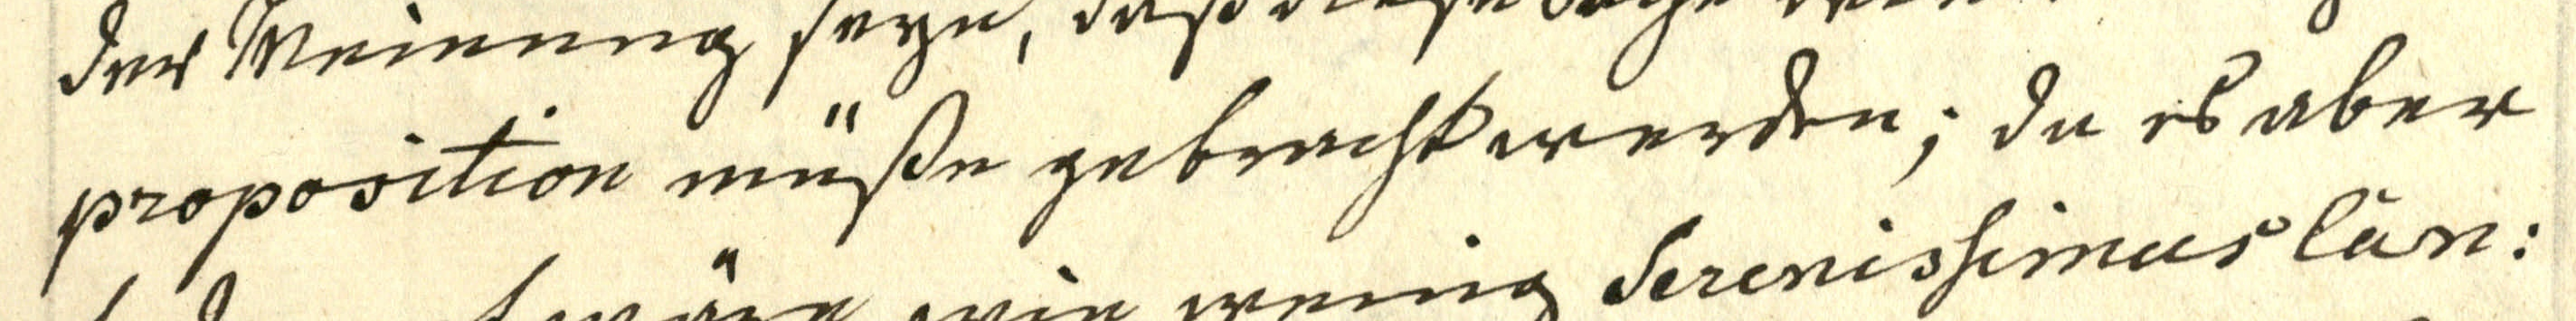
proposition müße gebracht werden; da es aber
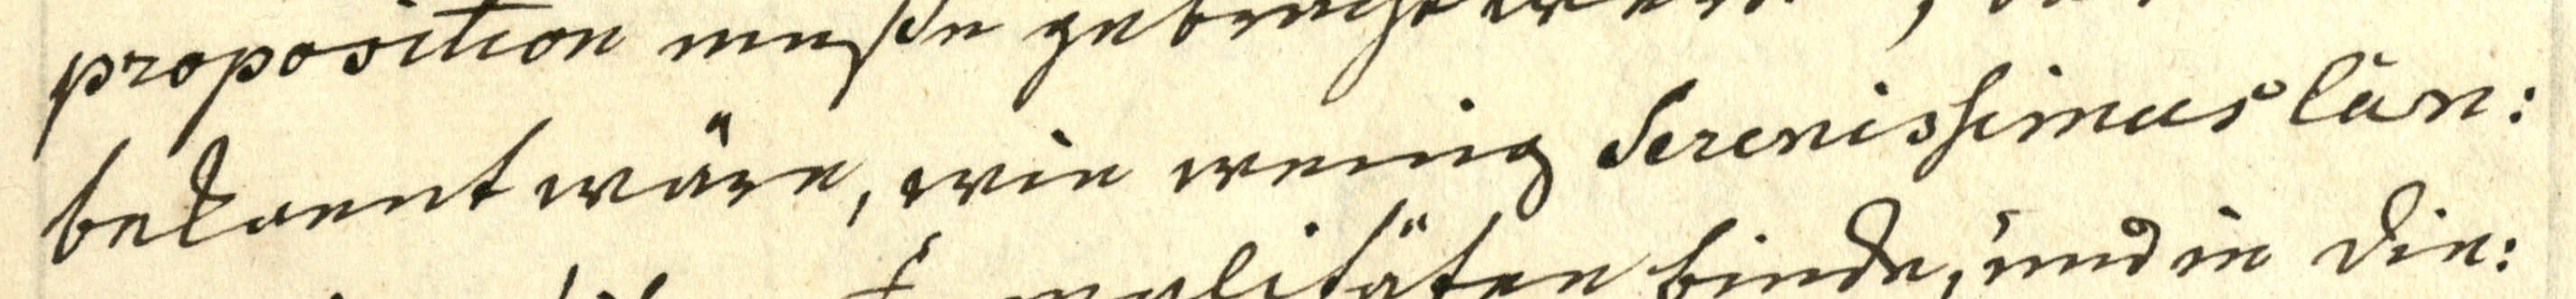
bekannt wäre, wie wenig Serenissimus Can¬
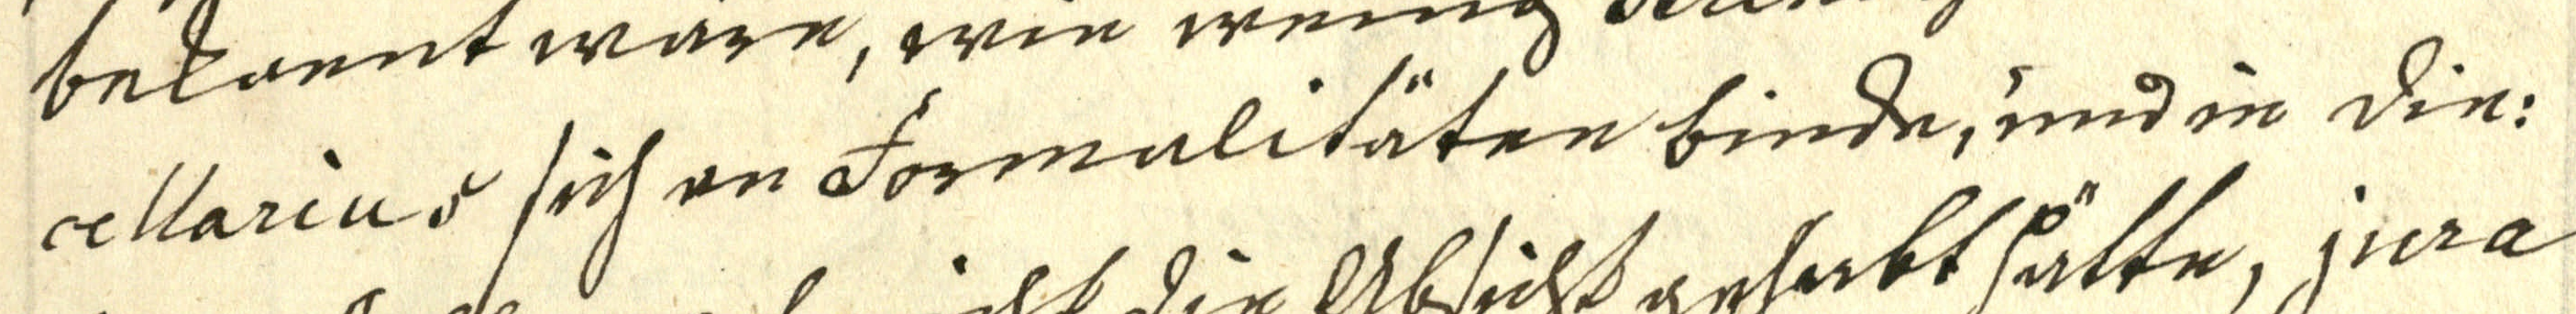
cellarius sich an Formalitäten binde und in die¬
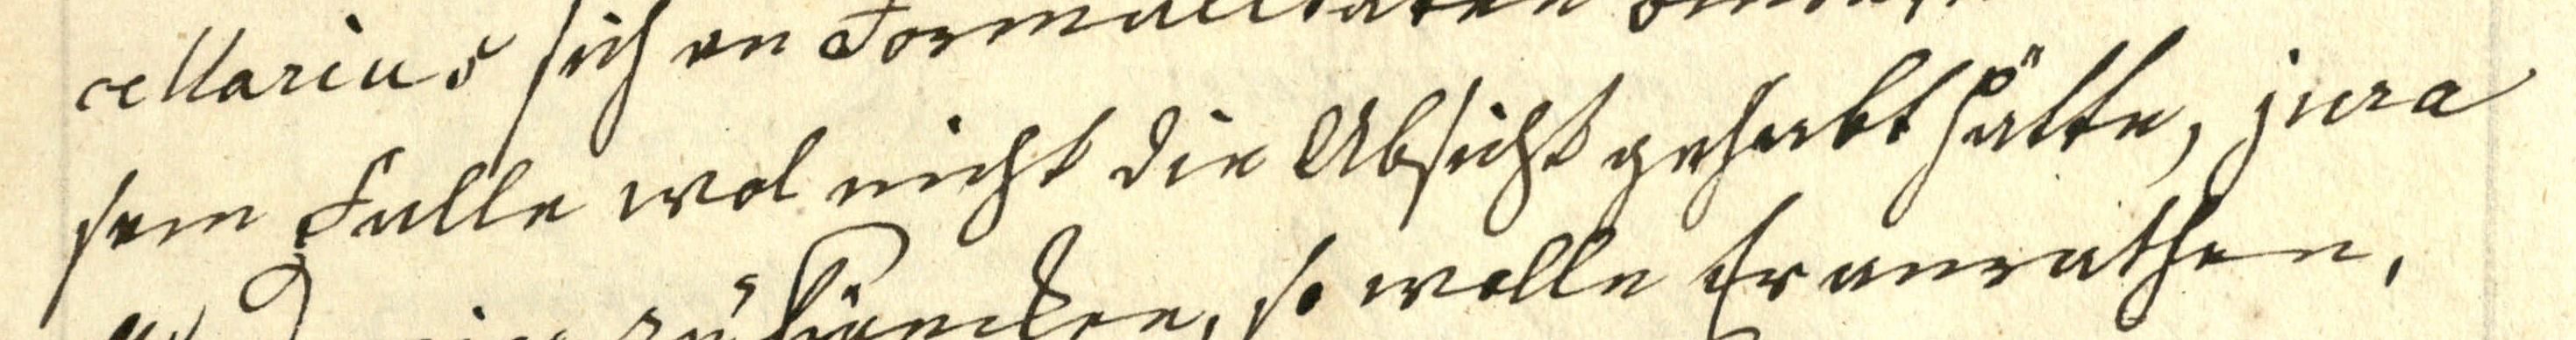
sem Falle wol nicht die Absicht gehabt hätte, jura
